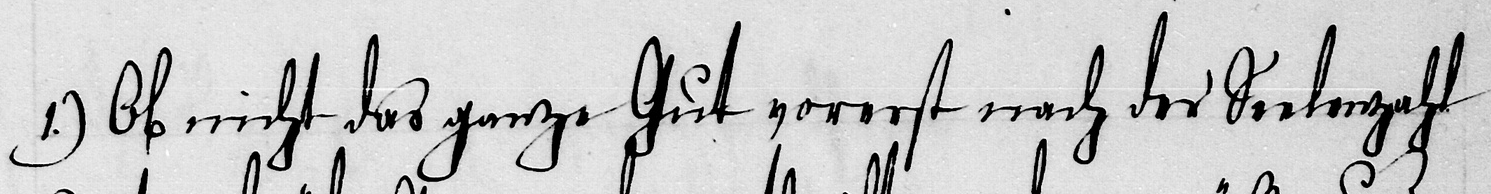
1.) Ob nicht das ganze Gut vorerst nach der Seelenzahl
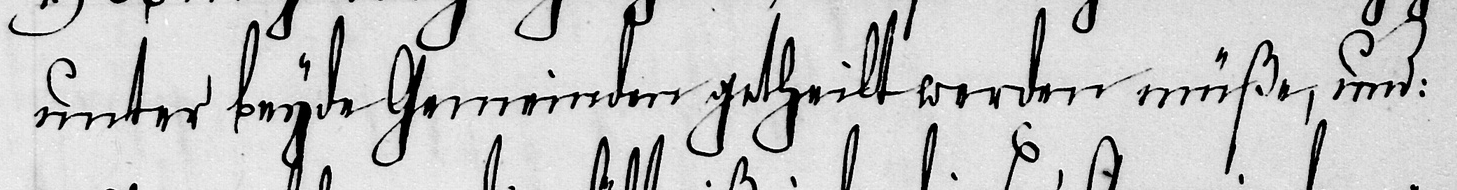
unter beyde Gemeinden getheilt werden müße, und:
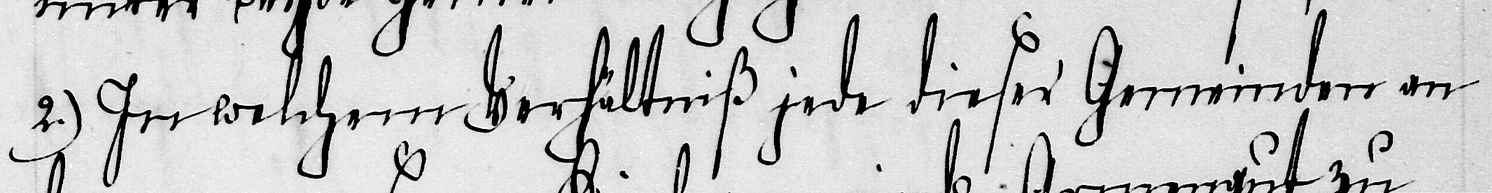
2.) In welchem Verhältniß jede dieser Gemeinden an
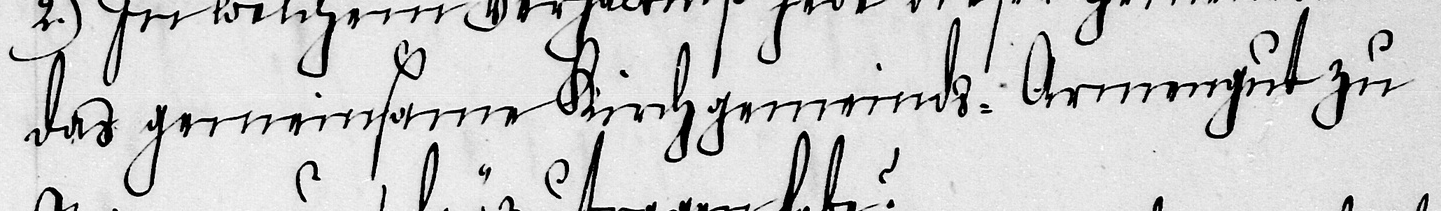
das gemeinsame Kirchgemeinds-Armengut zu
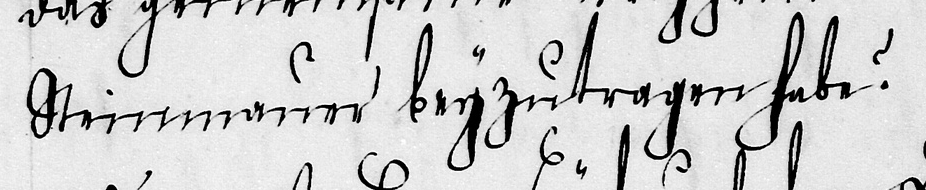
Steinmauer beyzutragen habe?
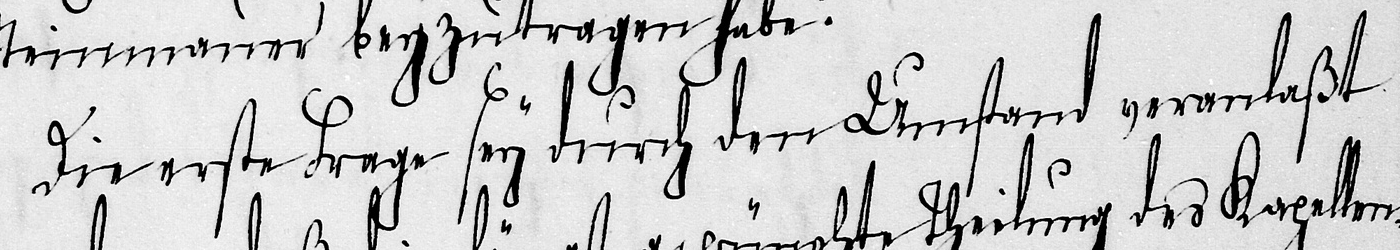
Die erste Frage sey durch den Umstand veranlaßt
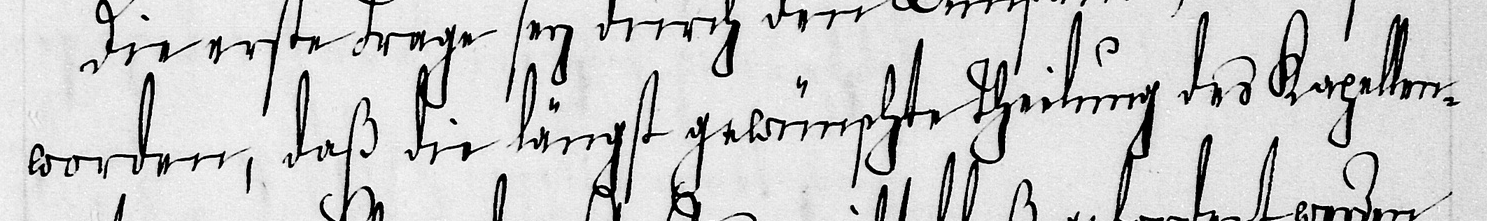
worden, daß die längst gewünschte Theilung des Kapellen¬
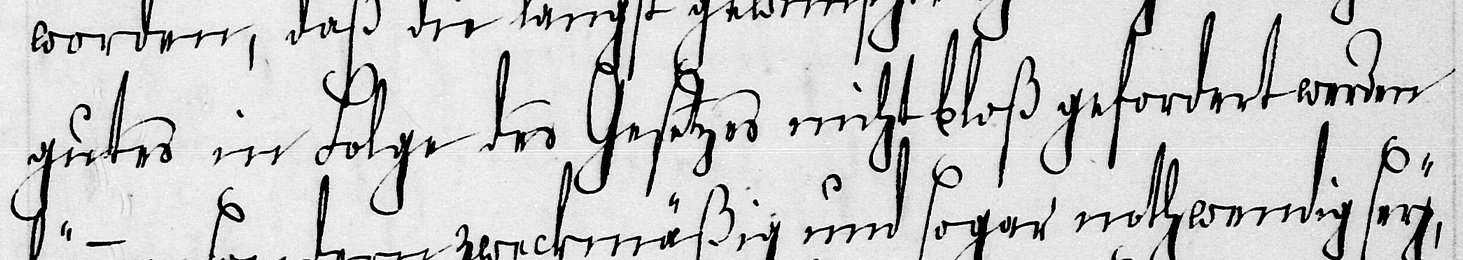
gutes in Folge des Gesetzes nicht bloß gefordert werden
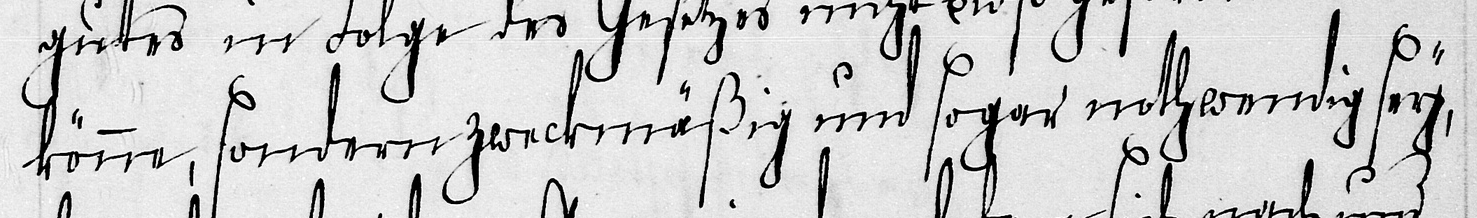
könne, sondern zweckmäßig und sogar nothwendig sey,
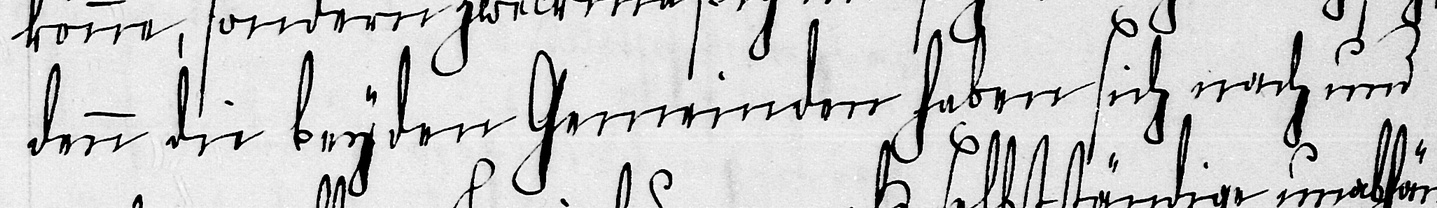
denn die beyden Gemeinden haben sich nach und
